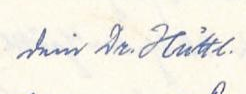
dein Dr. Hüttl.
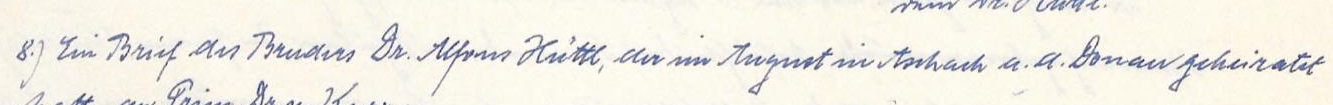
8.) Ein Brief des Bruders Dr. Alfons Hüttl, der im August in Aschach a.d. Donau geheiratet
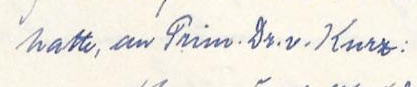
hatte, an Prim. Dr. v. Kurz:
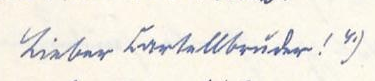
Lieber Cartellbruder!4)
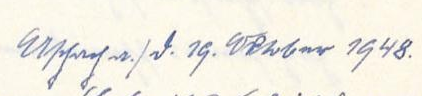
Aschach a /d, 19. Oktober 1948.
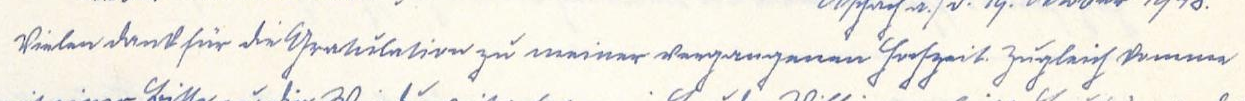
Vielen Dank für die Gratulation zu meiner vergangenen Hochzeit. Zugleich komme
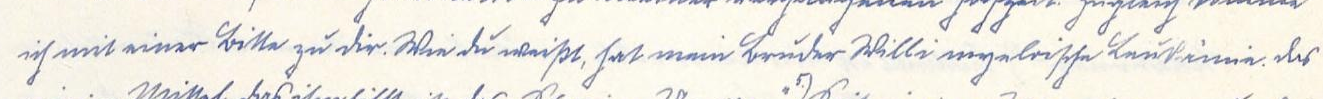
ich mit einer Bitte zu Dir. Wie du weißt, hat mein Bruder Willi myeloische Leukämie, das
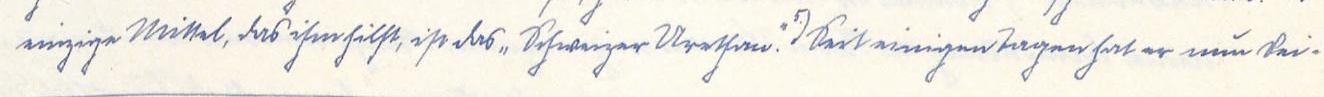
einzige Mittel, das ihm hilft, ist das „Schweizer Urethan" .5) Seit einigen Tagen hat er nun kei-
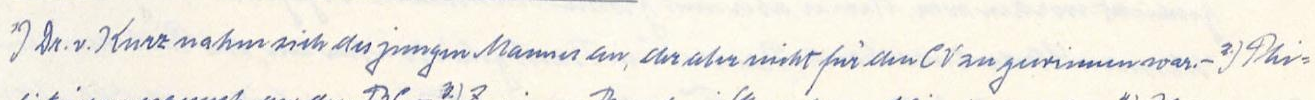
1.) Dr. v. Kurz nahm sich des jungen Mannes an, der aber nicht für den CV zu gewinnen war.- 2.) Phi-
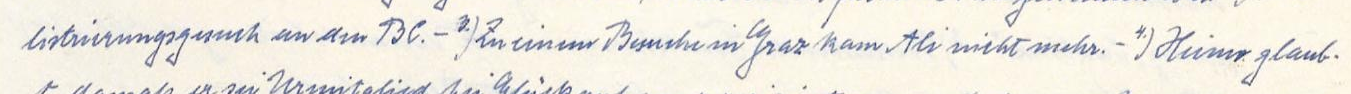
listrierungsgesuch an den BC.- 2) Zu einem Besuche in Graz kam Ali nicht mehr. - ) Heimo glaub-
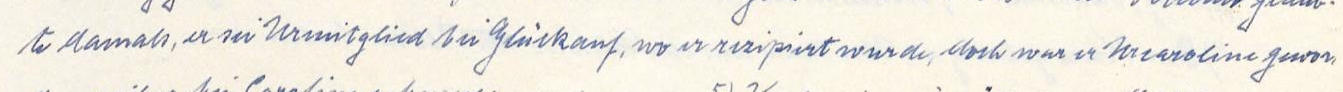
te damals, er sei Urmitglied bei Glückauf, wo er rezipiert wurde, doch war er Caroline gewor-
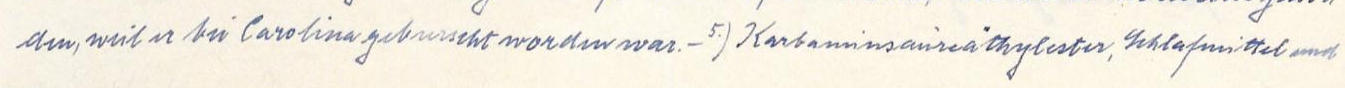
den, weil er bei Carolina geburscht worden war. 5) Karbeminsäureäthylester, Schlafmittel und
